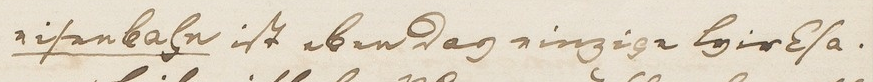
eisenbahn ist eben das einzige wirksa-
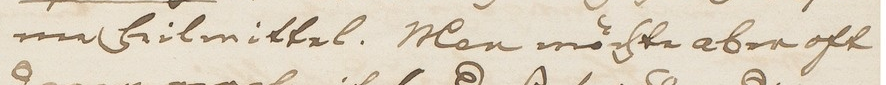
me Heilmittel. Man möchte aber oft
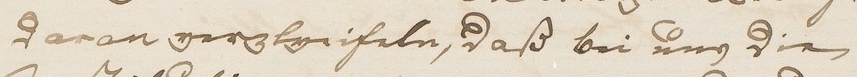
daran verzweifeln, daß bei uns die
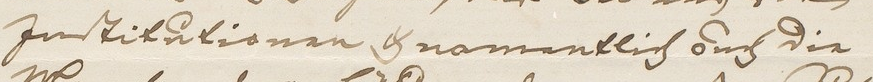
Institutionen & namentlich auch die
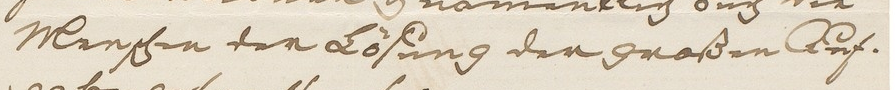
Menschen der Lösung der großen Auf-
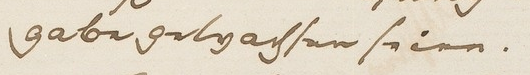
gabe gewachsen seien.
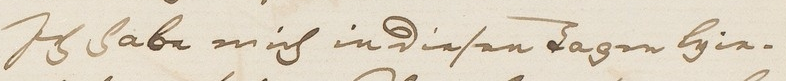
Ich habe mich in diesen Tagen wie-
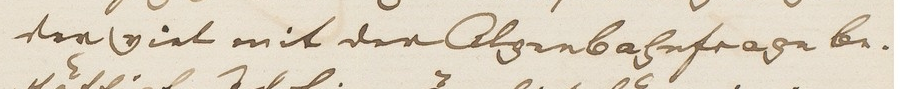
der viel mit der Alpenbahnfrage be-
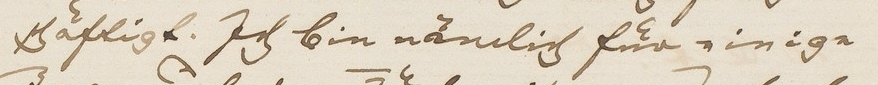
schäftigt. Ich bin nämlich für einige
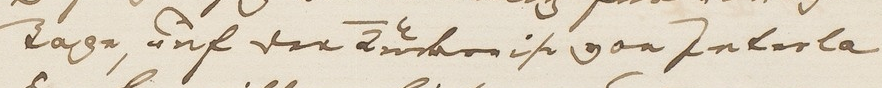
Tage, auf der Rückreise von Interla-
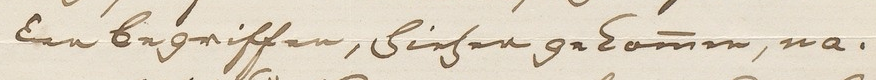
ken begriffen, hieher gekommen, na-
